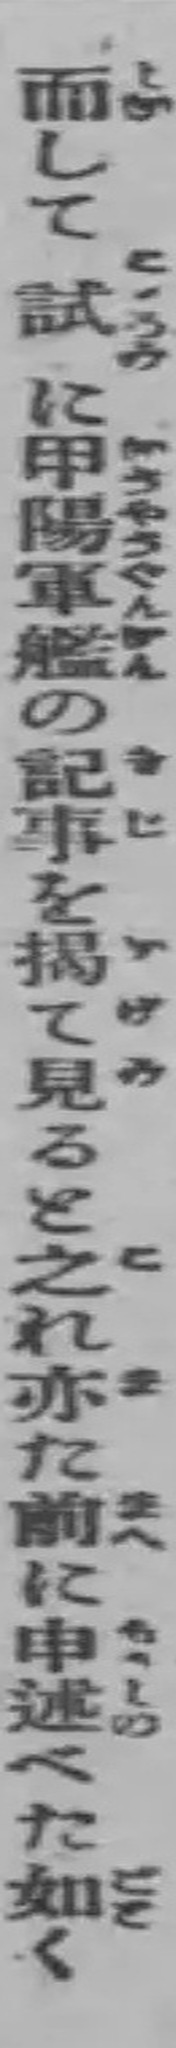而して試に甲陽軍鑑の記事を掲て見ると之れ亦た前に申述べた如く
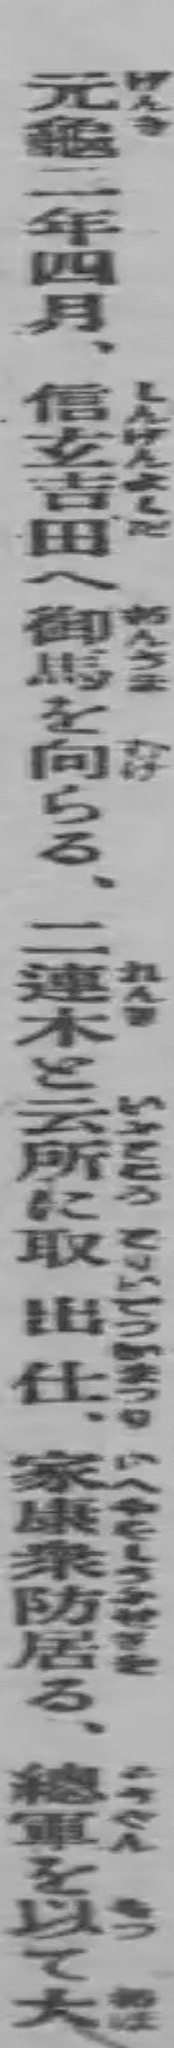元亀二年四月、信玄吉田へ御馬を向らる、二連木と云所に取出仕、家康衆防居る、総軍を以て大
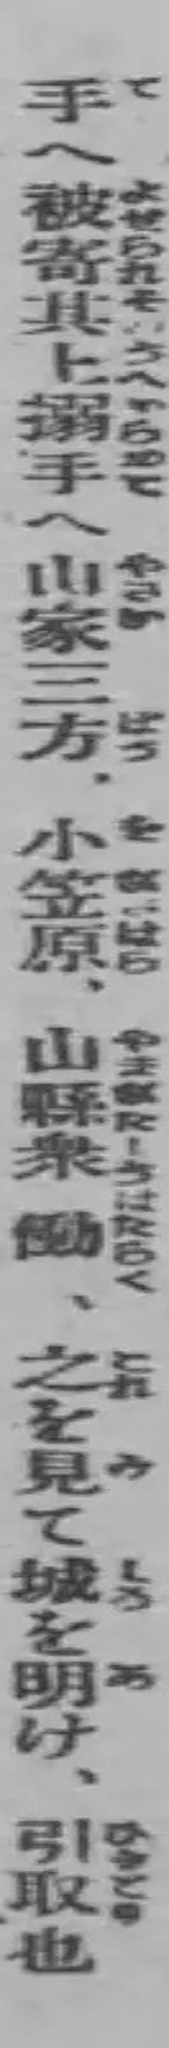手へ被寄其上搦手へ山家三方、小笠原、山縣衆働、之を見て、城を明け、引取也
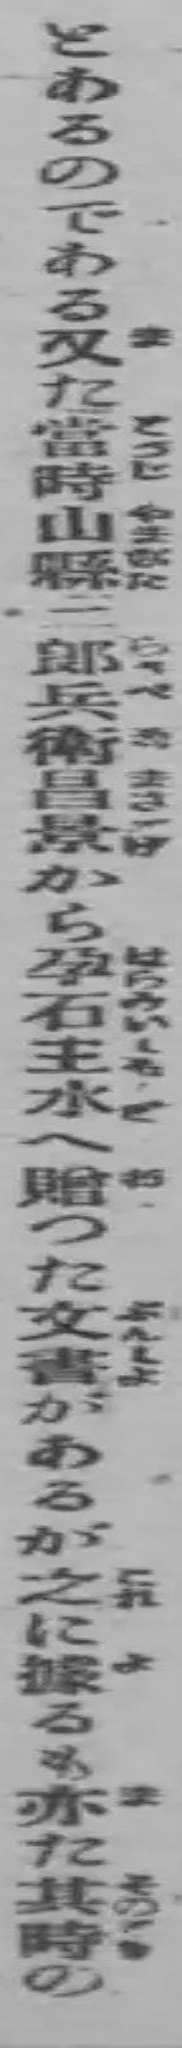とあるのである又た当時山縣三郎兵衛昌景から孕石主水へ贈つた文書があるが之に拠るも亦た其時の
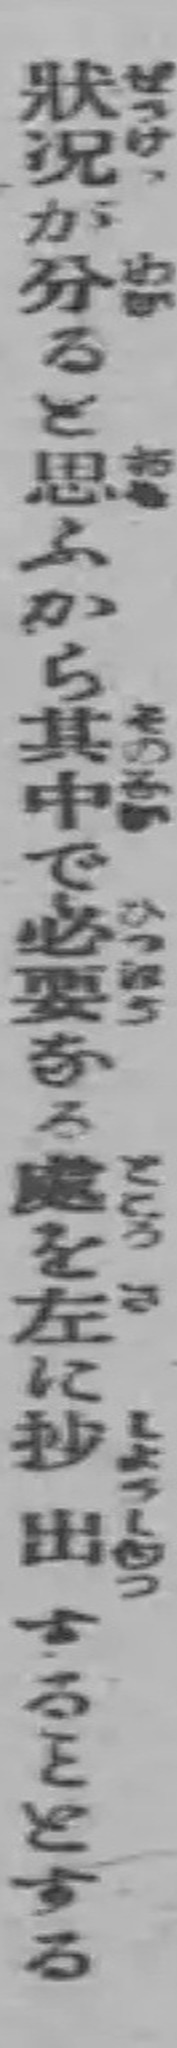状況が分ると思ふから其中で必要なる処を左に抄出することとする
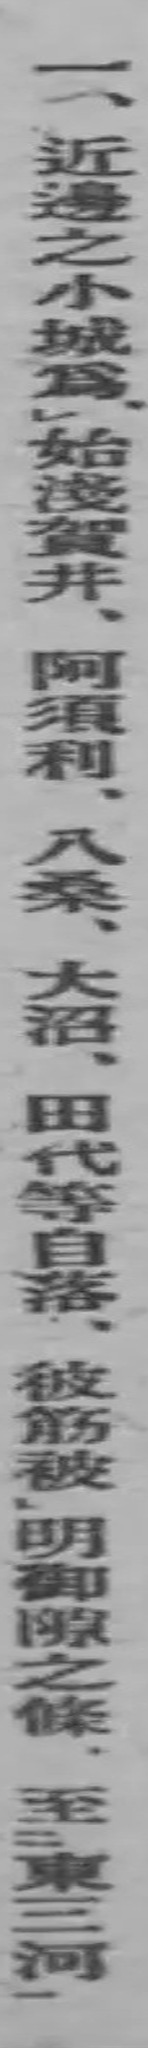一、近辺之小城為始浅賀井、阿須利、八桑、大沼、田代等自落、彼筋被明御隙之条、至東三河
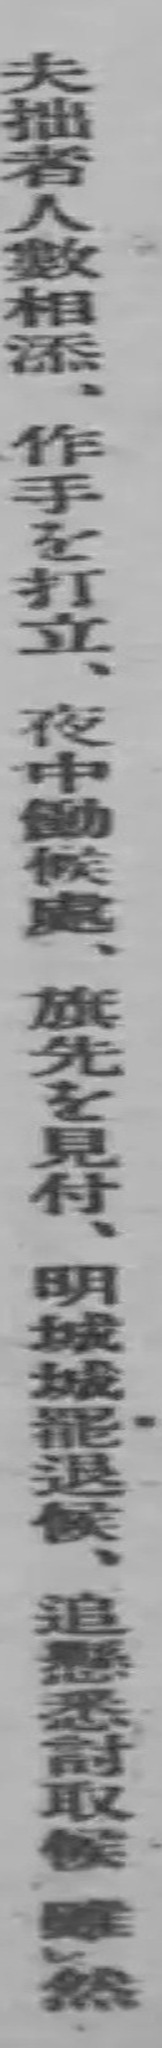夫拙者人数相添、作手を打立、夜中働候処、旗先を見付、明城城罷退候、追懸悉討取候、雖然
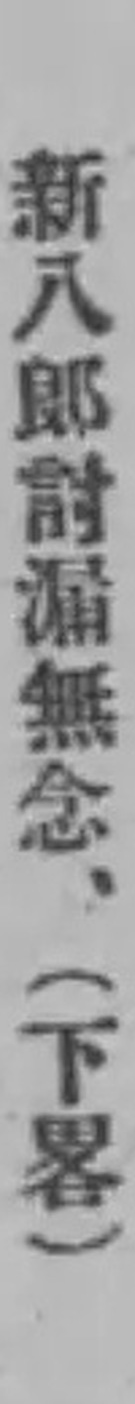新八郎討漏無念、(下略)
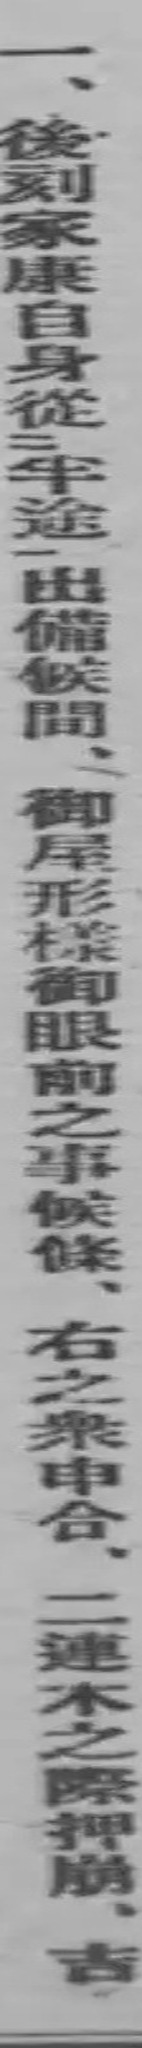一、後刻家康自身従半途出備候間、御屋形様御眼前之事候条、右之衆申合、二連木之際押崩、吉
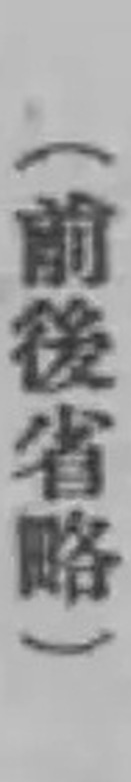(前後省略)
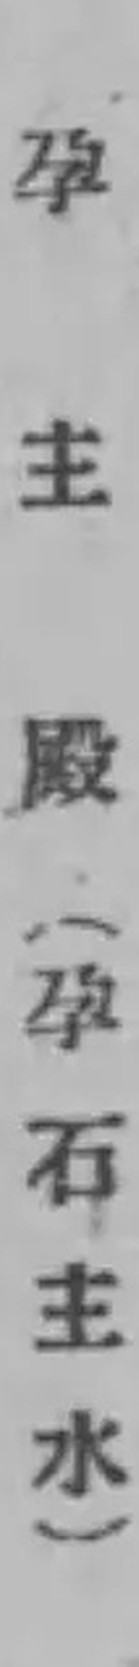孕主殿(孕石主水)
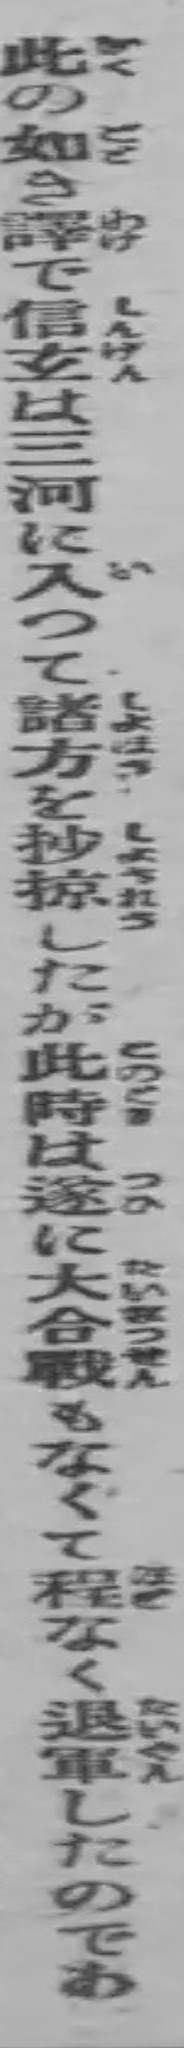此の如き訳で信玄は三河に入つて諸方を抄掠したが此時は遂に大合戦もなくて程なく退軍したのであ
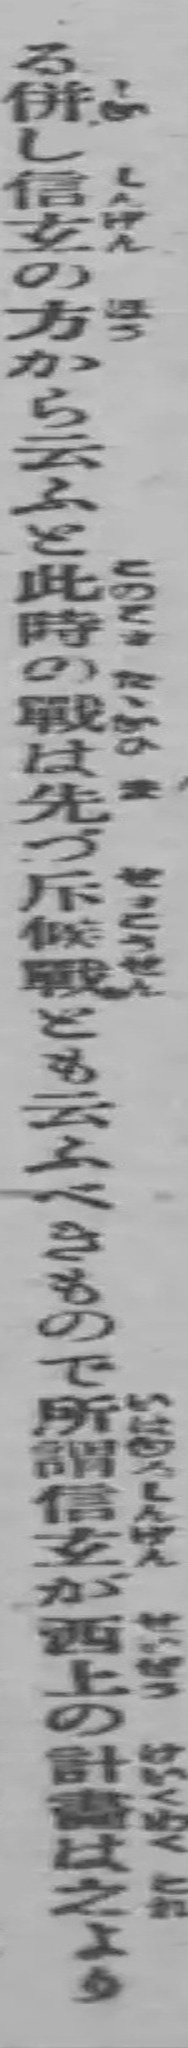る併し信玄の方から云ふと此時の戦は先づ斥候戦とも云ふべきもので所謂信玄が西上の計画は之より
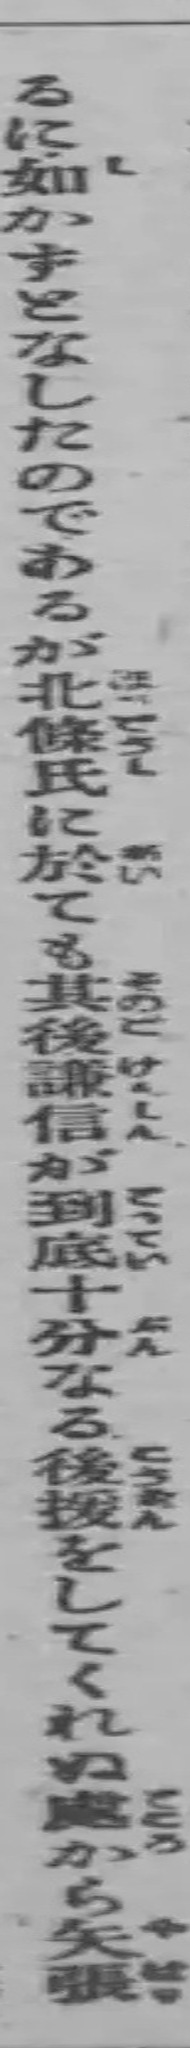るに如かずとなしたのであるが北条氏に於ても其後謙信が到底十分なる後援をしてくれぬ処から矢張
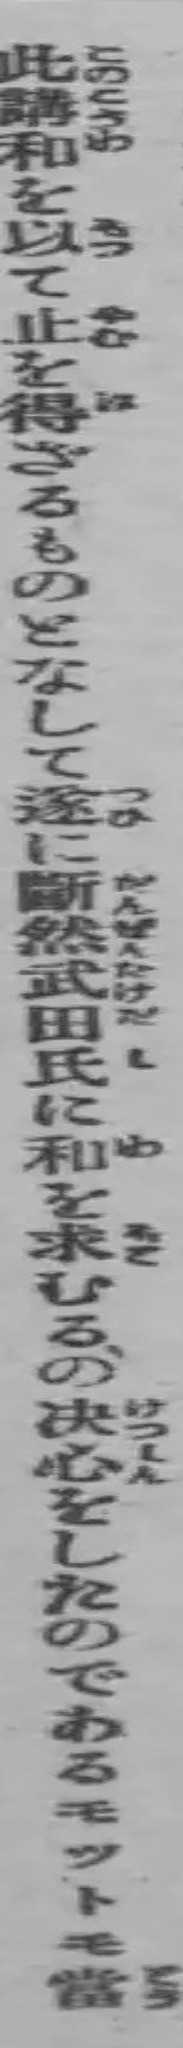此講話を以て止を得ざるものとなして遂に断然武田氏に和を求むるの決心をしたのであるモツトモ当
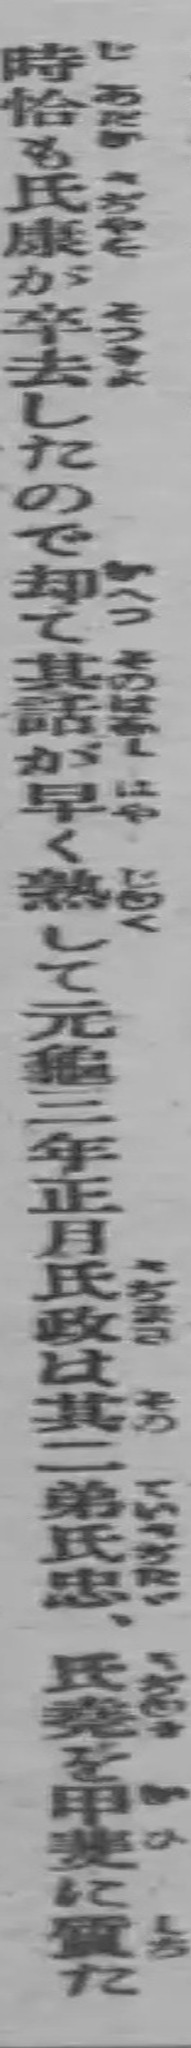時恰も氏康が卒去したので却て其話が早く熟して元亀三年正月氏政は其二弟氏忠、氏堯を甲斐に質た
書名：豊橋市史談
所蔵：国立国会図書館 National Diet Library, JAPAN
